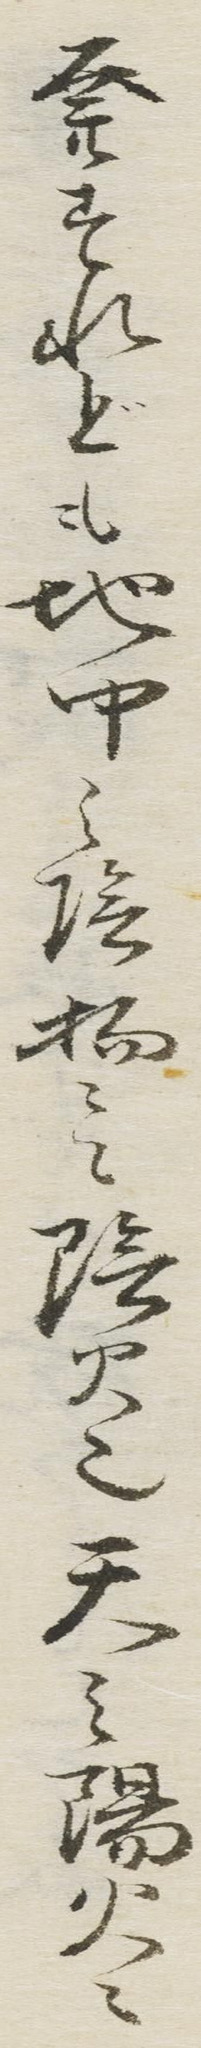発すれども地中之陰物ニて陰火也天の陽火ニ
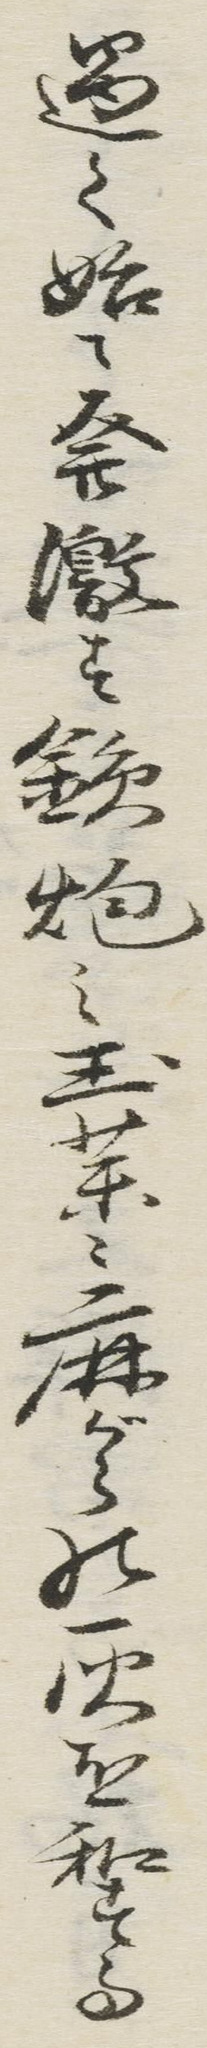遇て始て発激す鉄砲之玉薬ニ麻がらの灰を和する
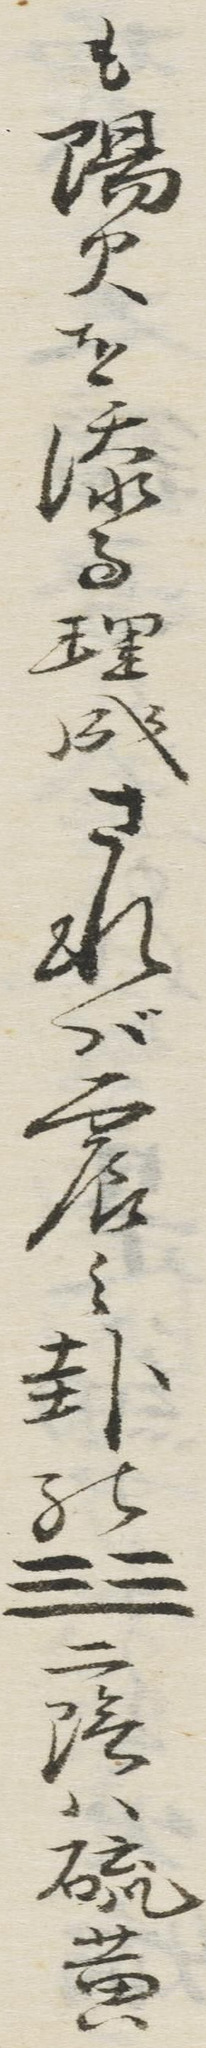も陽火を添る理成されバ震之卦の図略二陰ハ硫黄
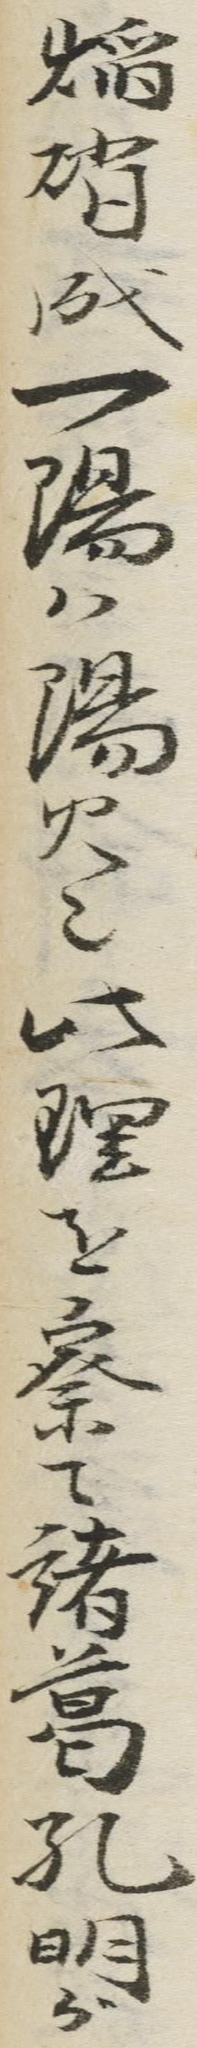焔硝成一陽ハ陽火也此理を察て諸葛孔明
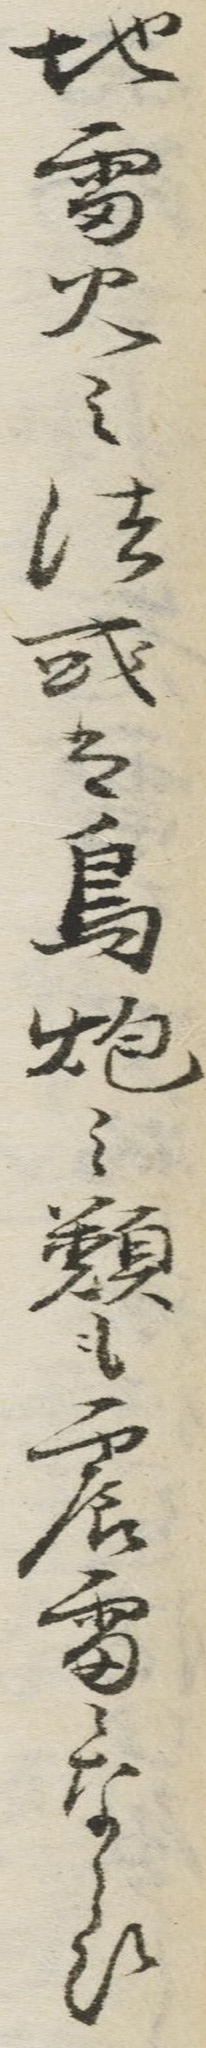が地雷火之法或は鳥砲之類も震雷ニならひ
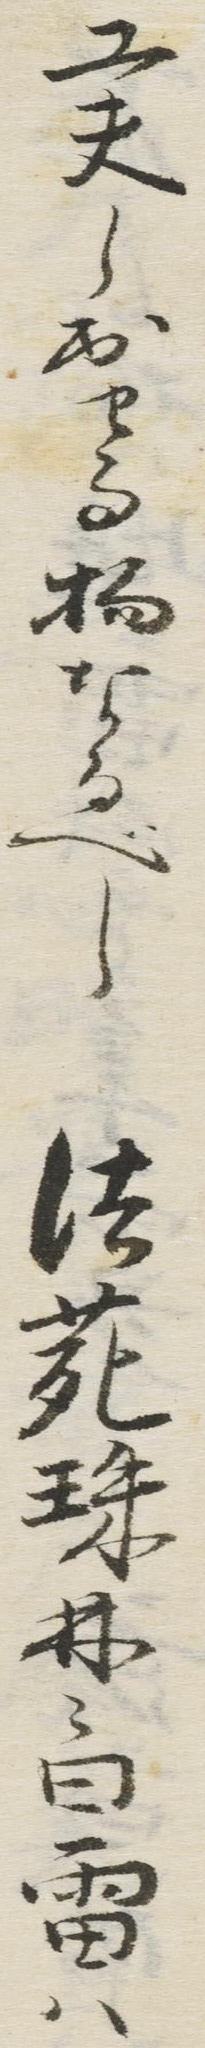工夫し出セる物なるべし法苑珠林ニ曰雷ハ
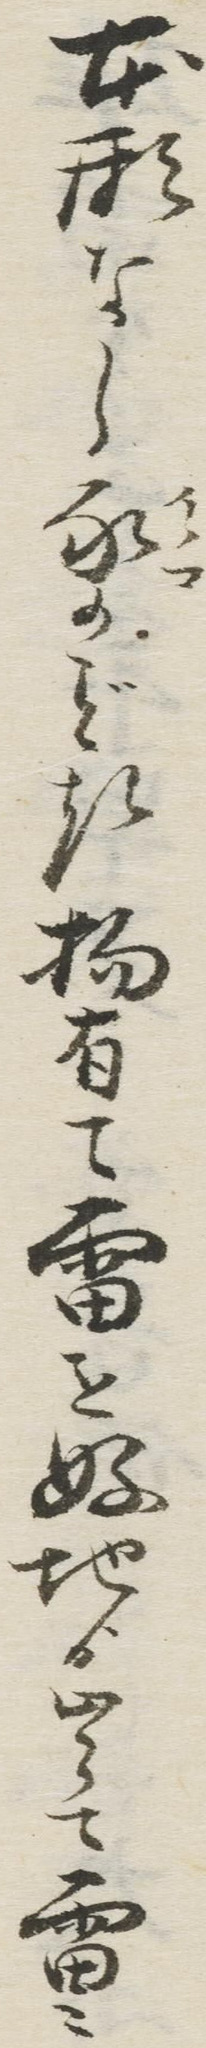本形なし豕のごとき物有て雷を好地ゟ出て雷ニ
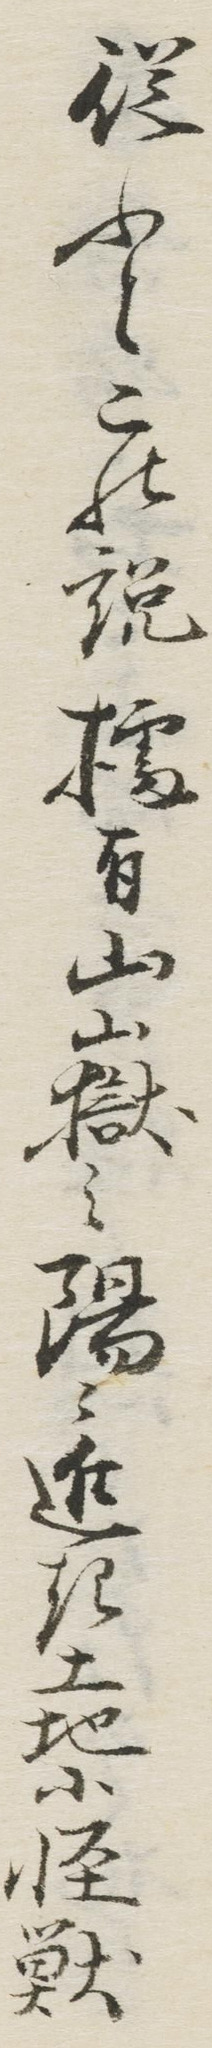従ふとこの説拠有山獄之陽ニ近き土地に怪獣
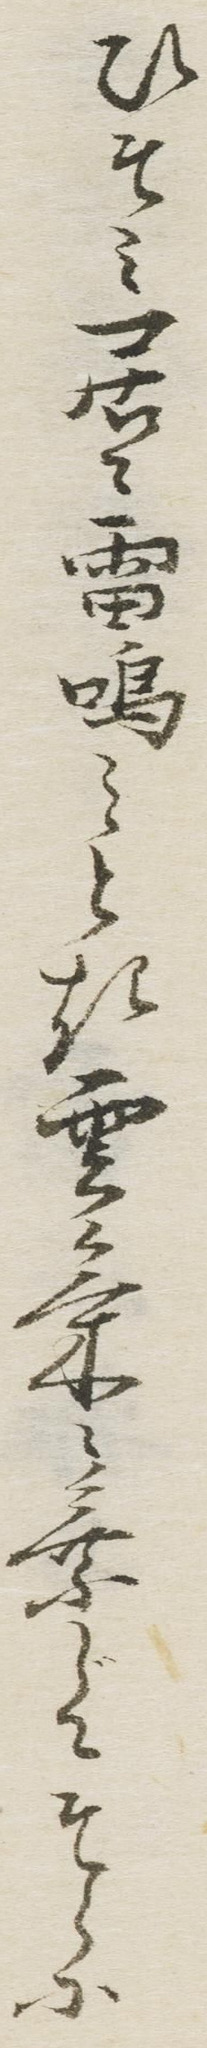ひそミ居て雷鳴のとき雲気ニ乗じてそらに
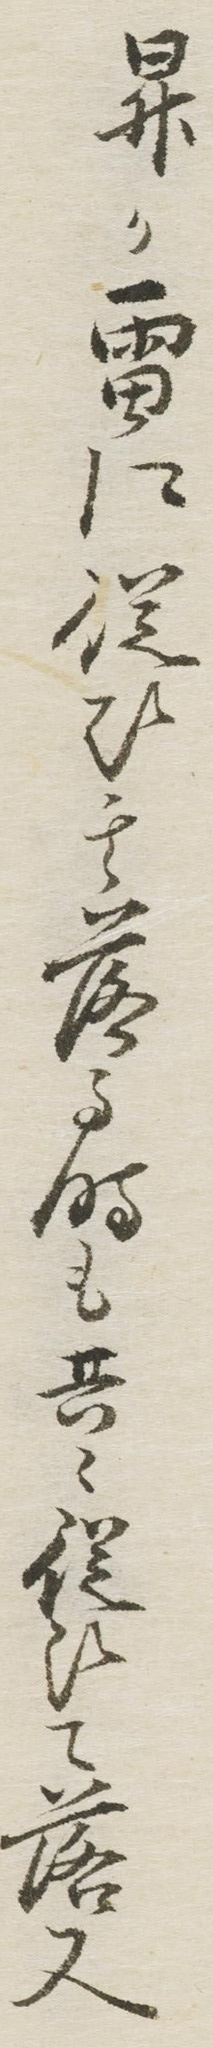昇り雷に従ひ其落る時も共ニ従ひて落人
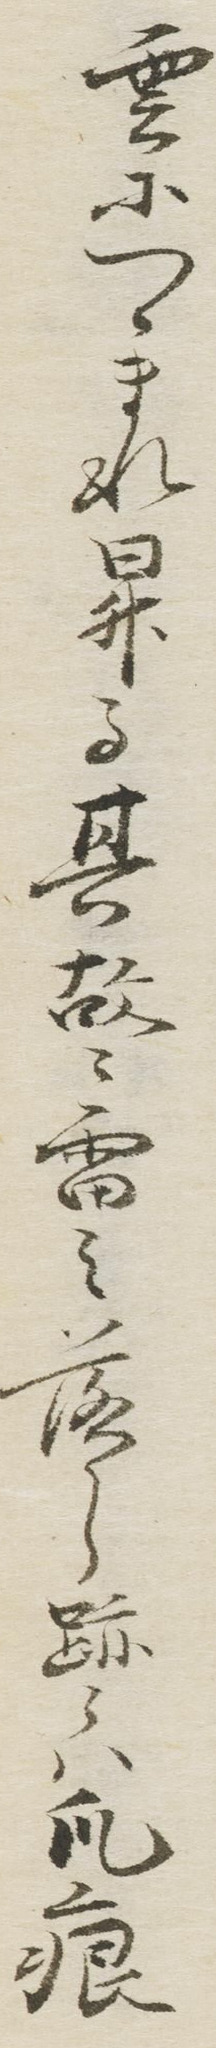雲につゝまれ昇る其故ニ雷之落し跡ニハ爪痕

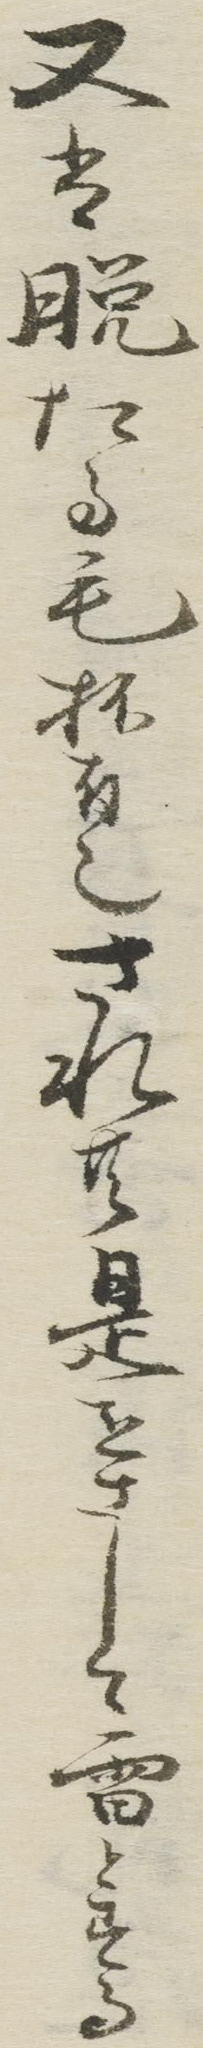又は脱たる毛抔有也され共是をさして雷とする
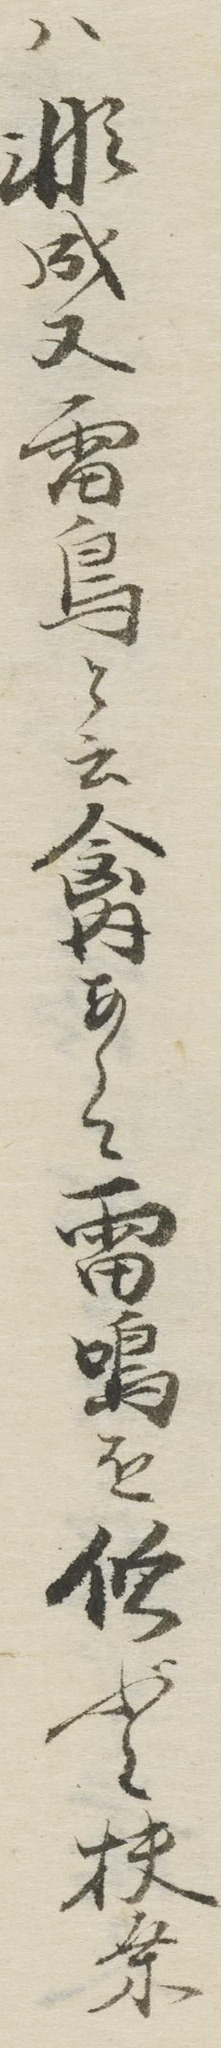ハ非成又雷鳥と云禽ありて雷鳴を欣ぶと扶桑
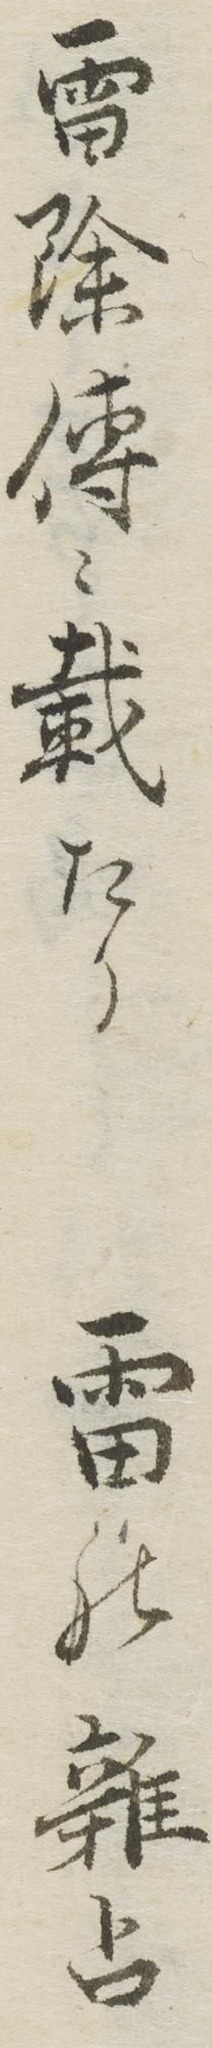雷除傳ニ載たり雷の雑占
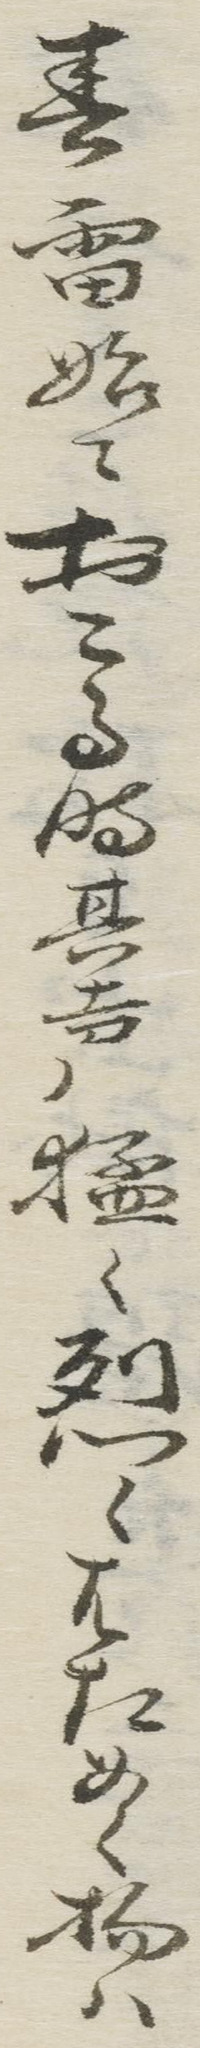春雷始ておこる時其声猛く烈くはためく物ハ
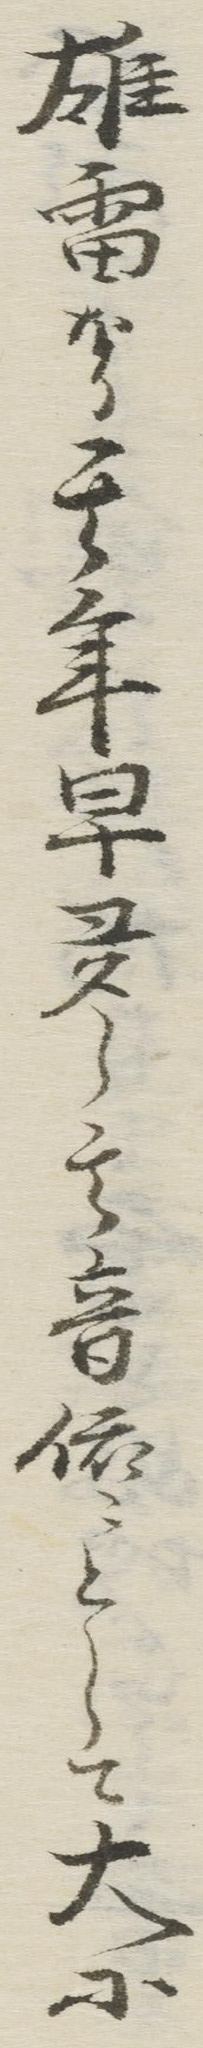雄雷なり其年早多し其音依ニとして大に
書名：諸国大地震大津波一代記
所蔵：東京大学地震研究所図書室 Earthquake Research Institute Library, The University of Tokyo, JAPAN
